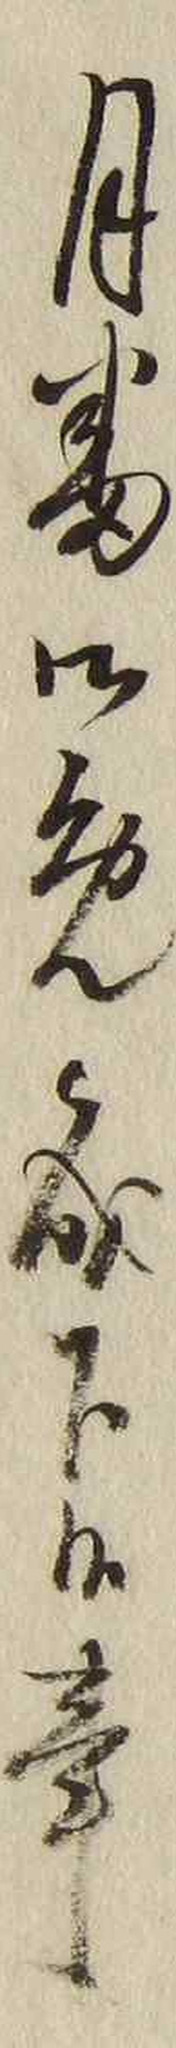月番御免被成下候事

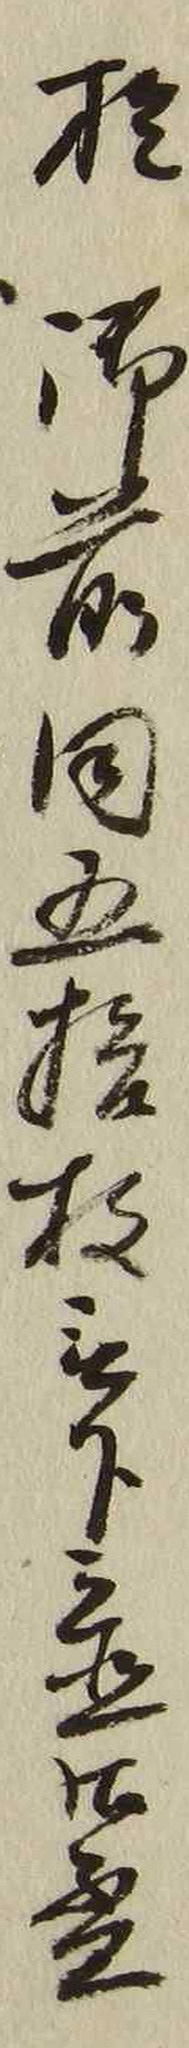於御前同五拾枚被下置御杯
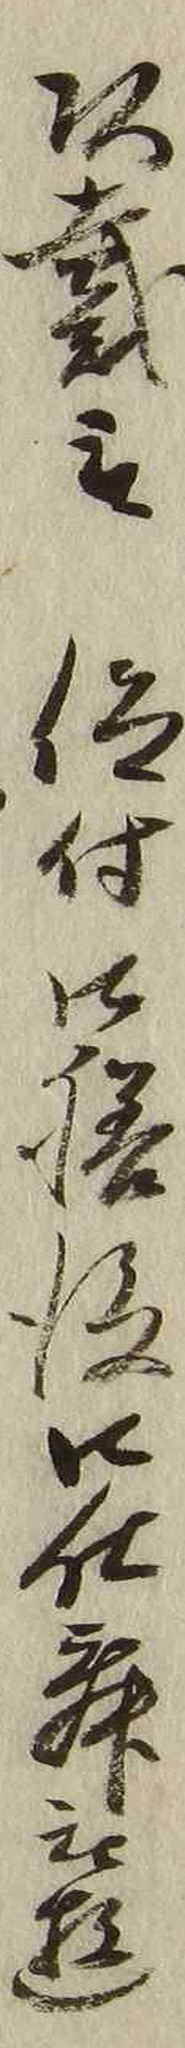頂戴被仰付御膳後御仕舞被遊
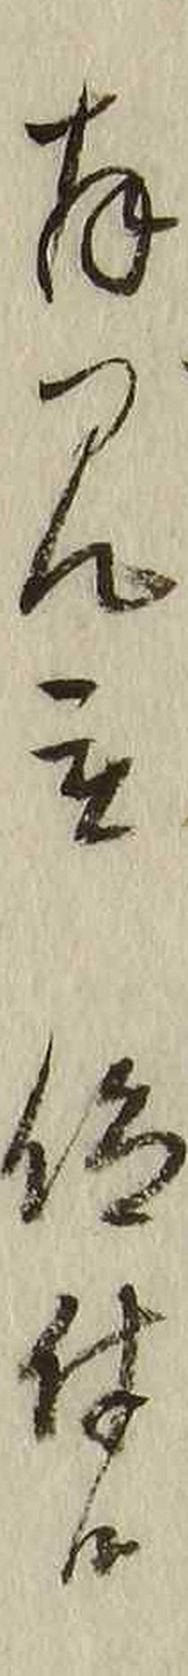拝見被仰付候
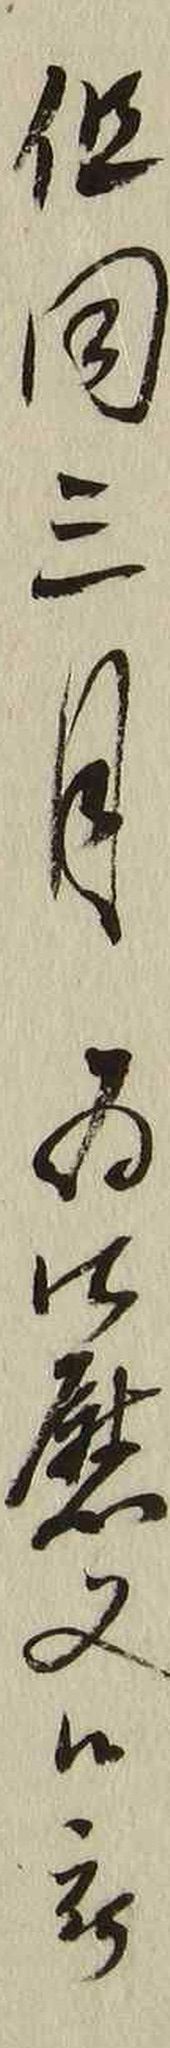但同三月為御熨又候被
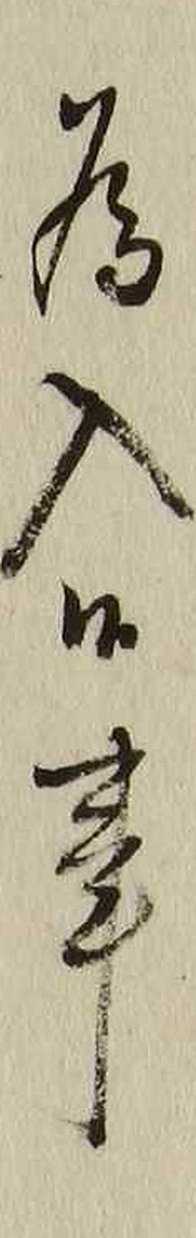為入候事
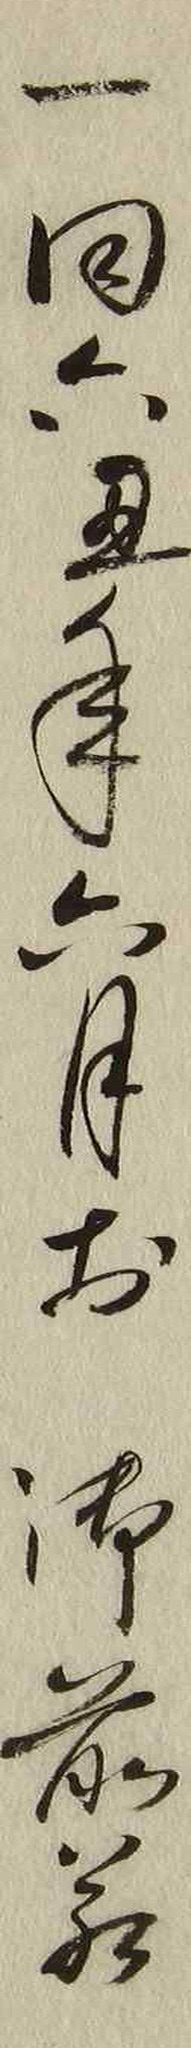一同六丑年六月於御前若
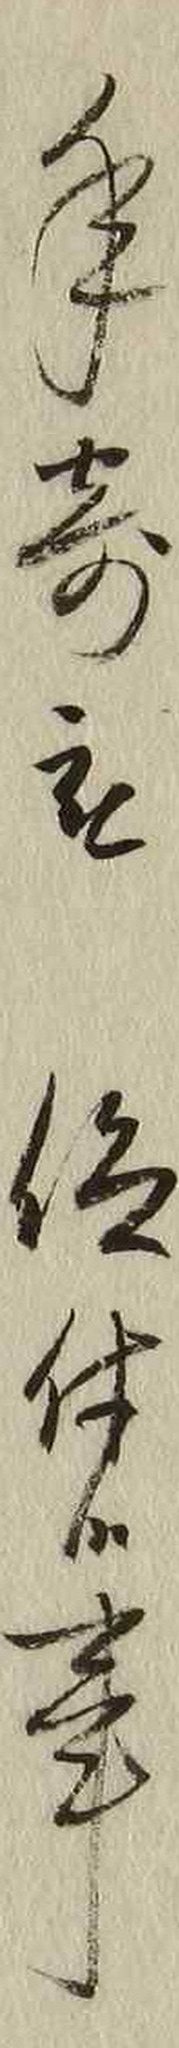年寄被仰付候事
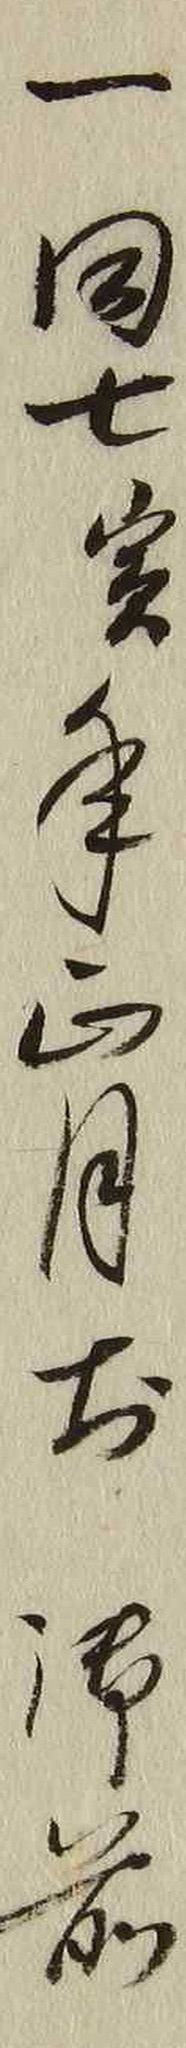一同七寅年正月於御前
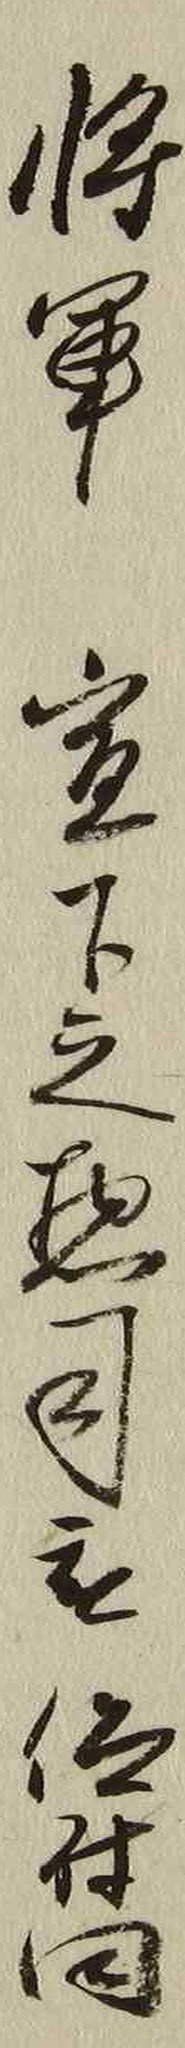将軍宣化之惣司被仰付同
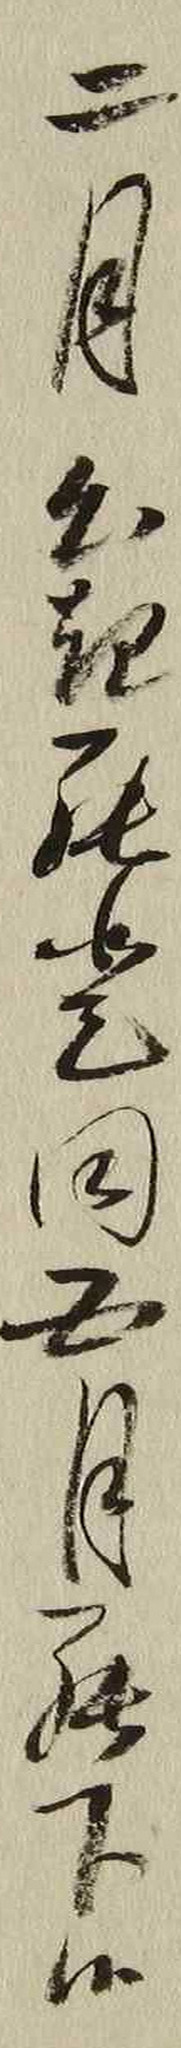二月出起罷登同五月罷下候
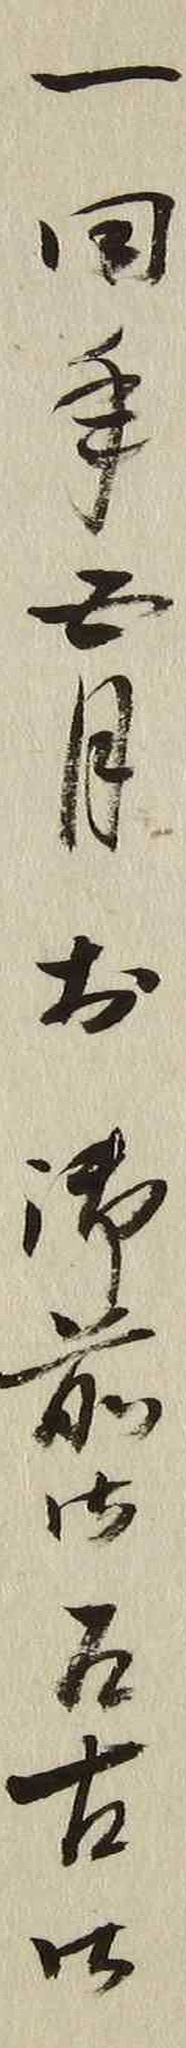一同年五月於御前御召古御
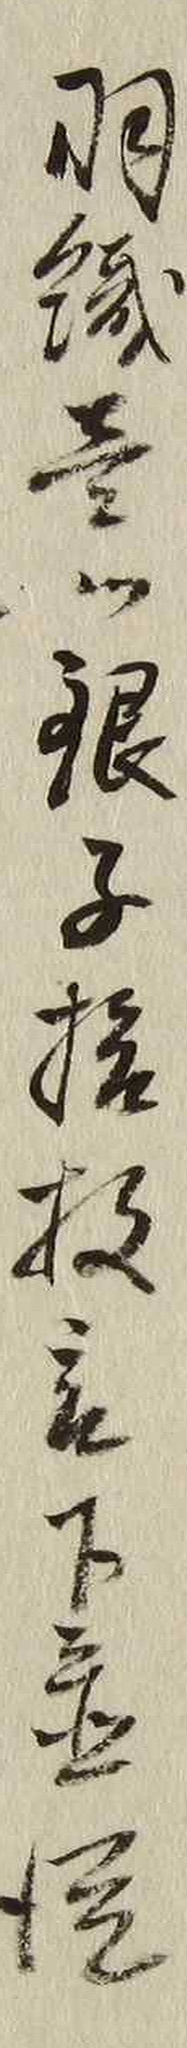羽織壱ツ銀子拾枚被下置従
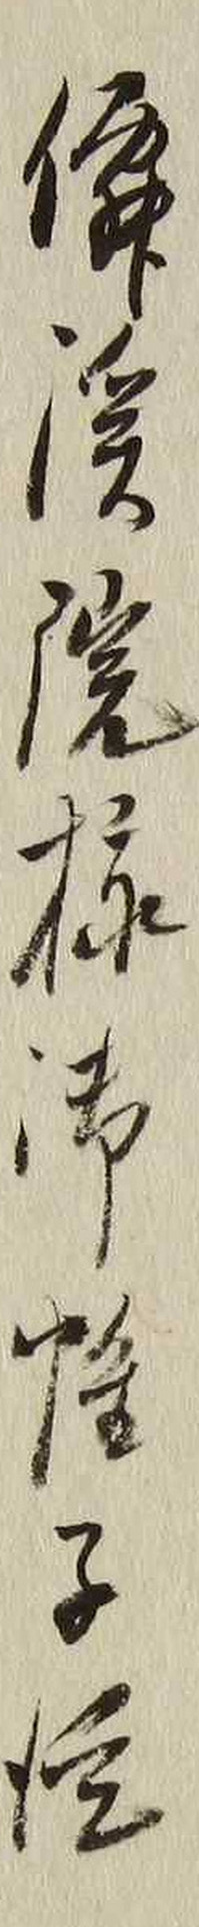仙渓院様御帷子従
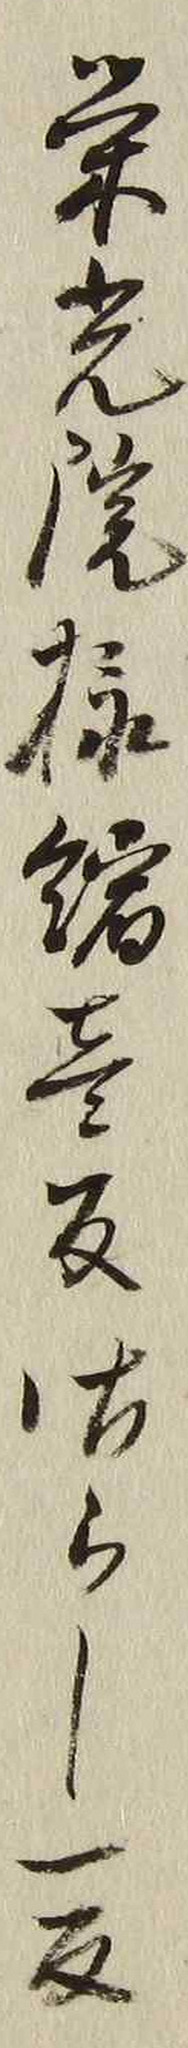栄光院様縮壱反さらし一反
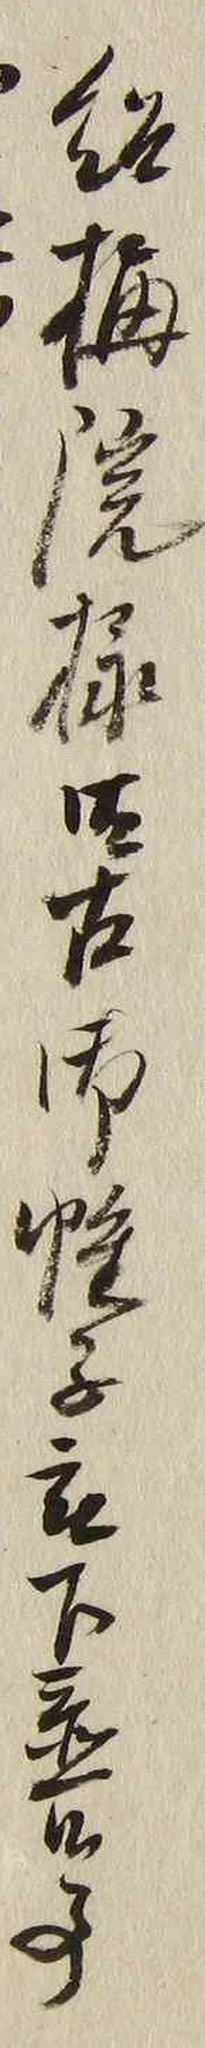紹栴院様御古御惟子被下置候事
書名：諸士系譜　巻之355　す之部5
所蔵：会津若松市立会津図書館
